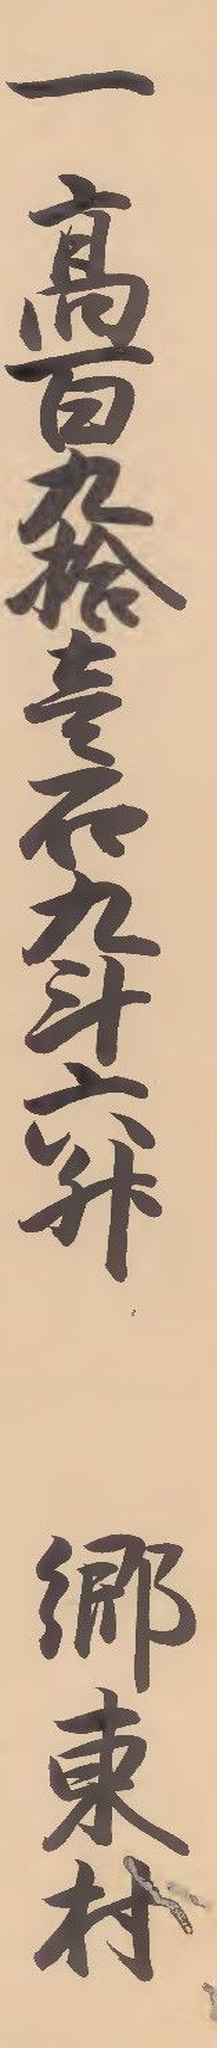一高百九拾壱石九斗六升郷東村
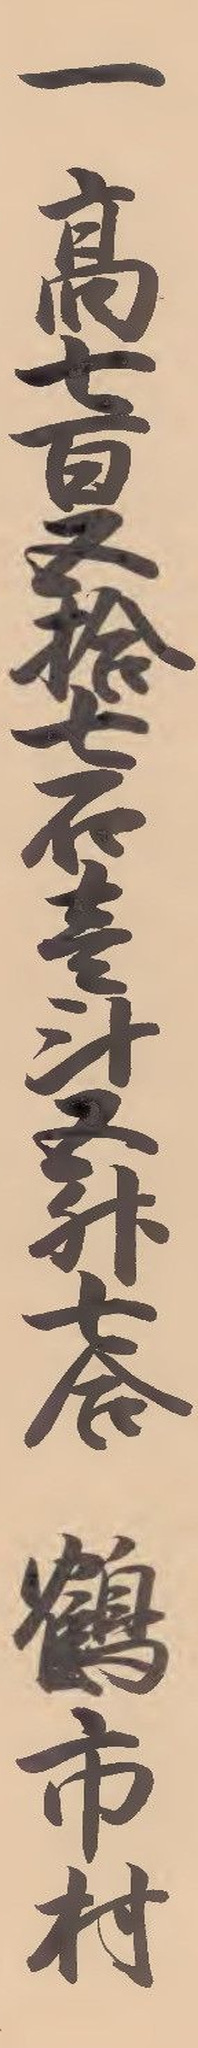一高七百五拾七石壱斗五升七合鶴市村
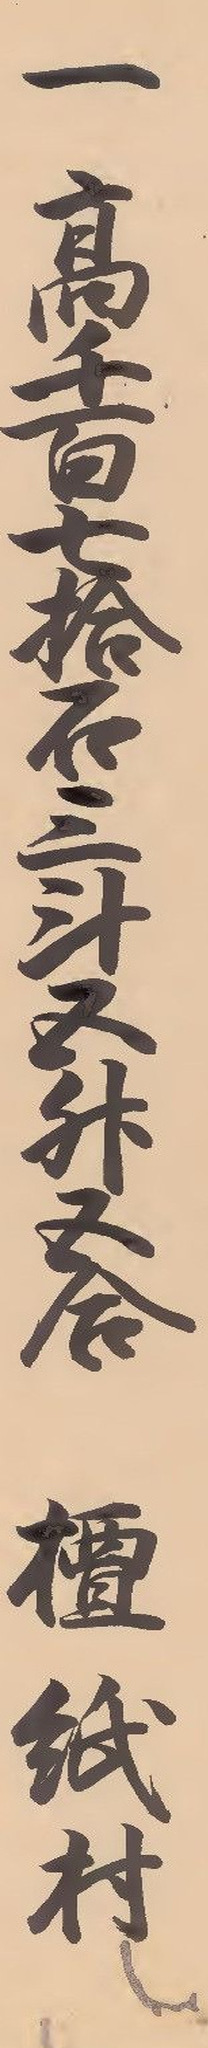一高千百七拾石三斗五升五合檀紙村
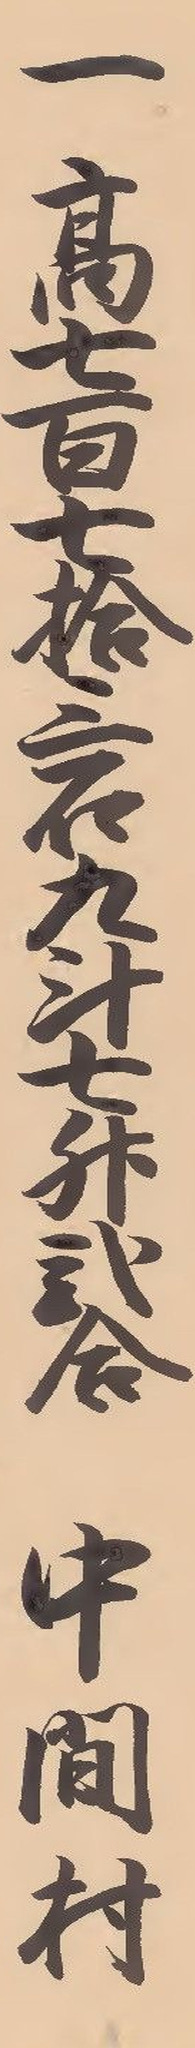一高七百七拾三石九斗七升弐合中間村
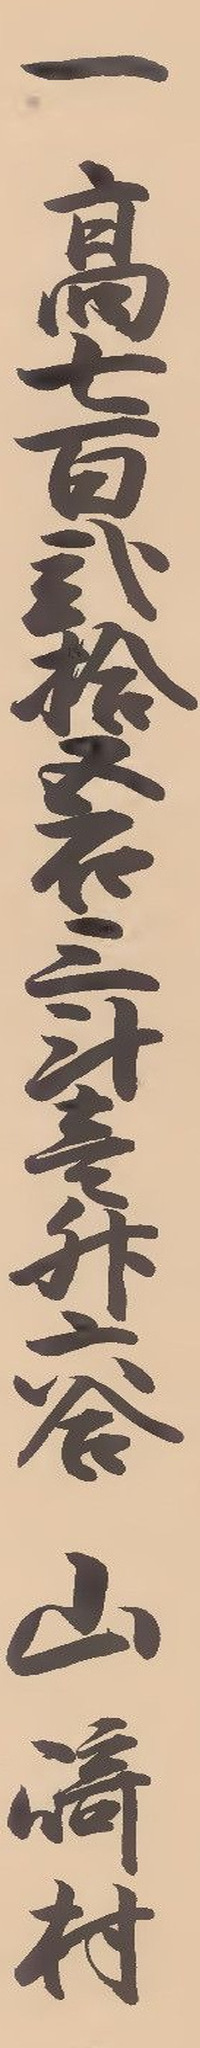一高七百弐拾五石三斗壱升六合山崎村
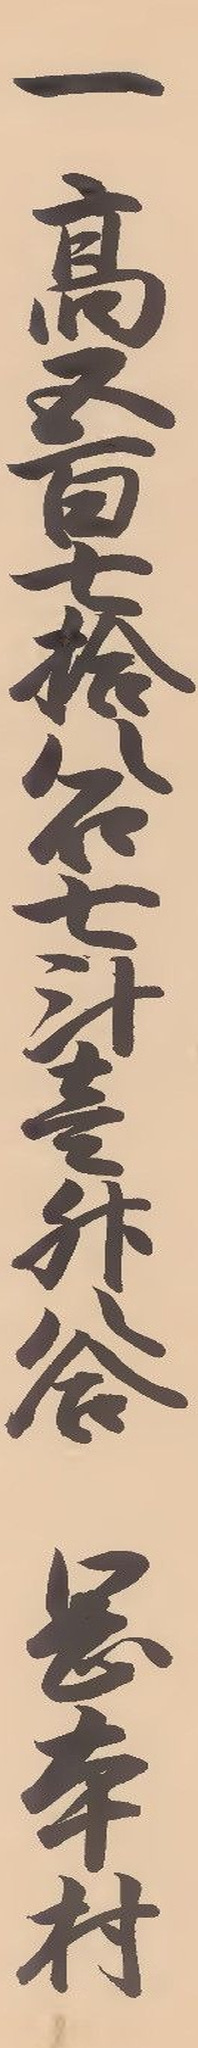一高五百七拾八石七斗壱升八合岡本村
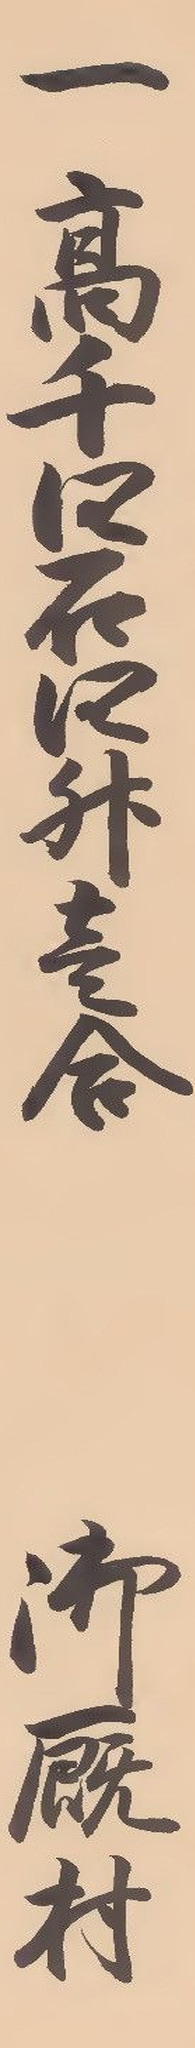一高千四石四升壱合御厩村
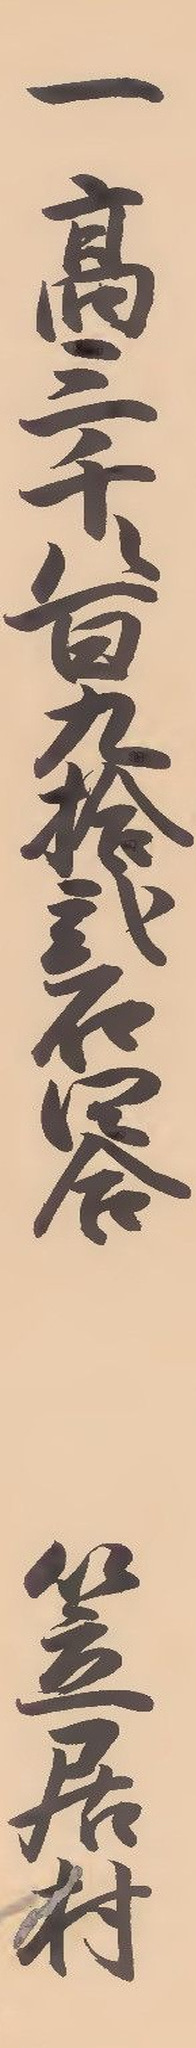一高三千八百九拾弐石四合笠居村

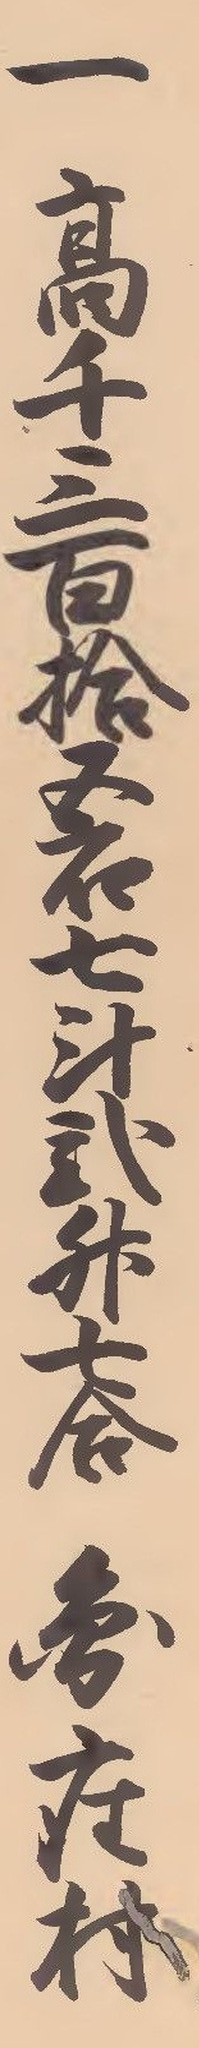一高千三百拾五右七斗弐升七合円座村
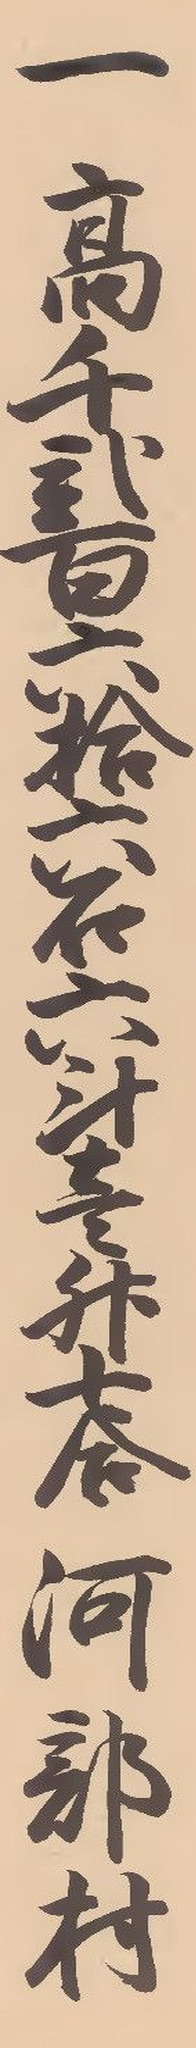一高千弐百六拾六石六斗壱升七合河部村
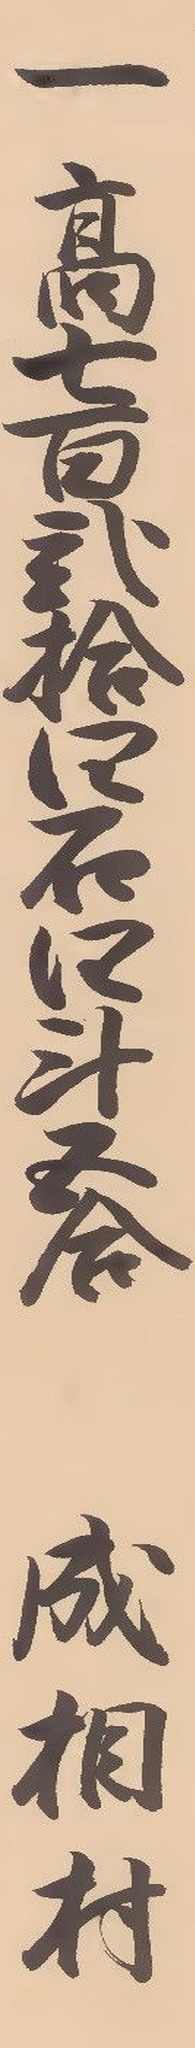一高七百弐拾四石四斗五合成相村
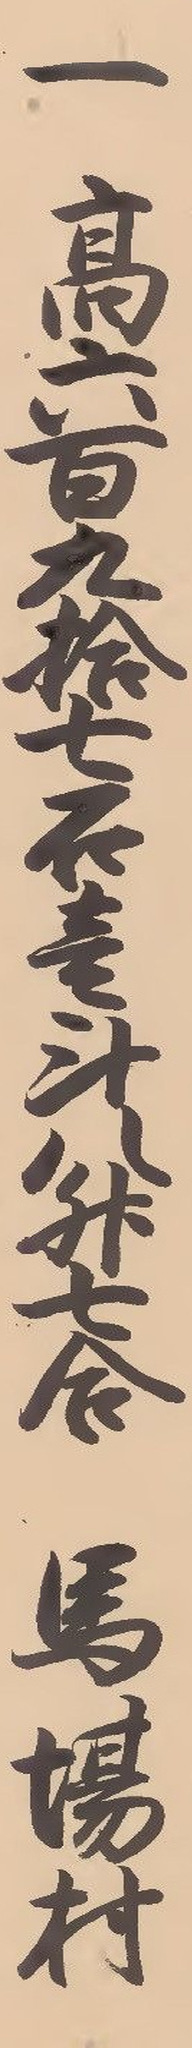一高六百九拾七石壱斗八升七合馬場村
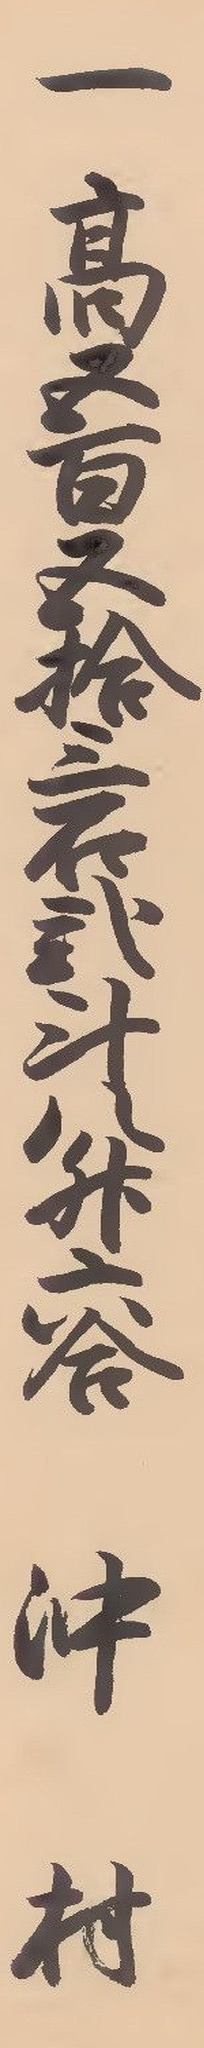一高五百五拾三石弐斗八升六合沖村
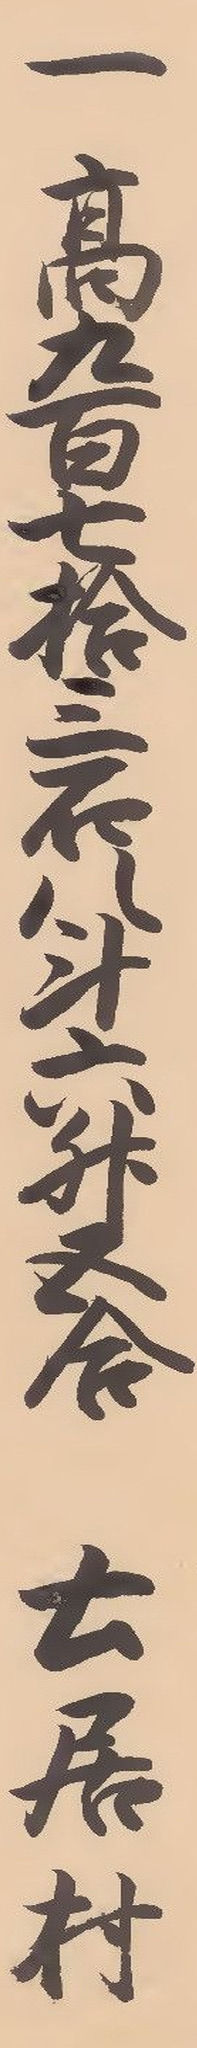一高九百七拾三石八斗六升五合土居村
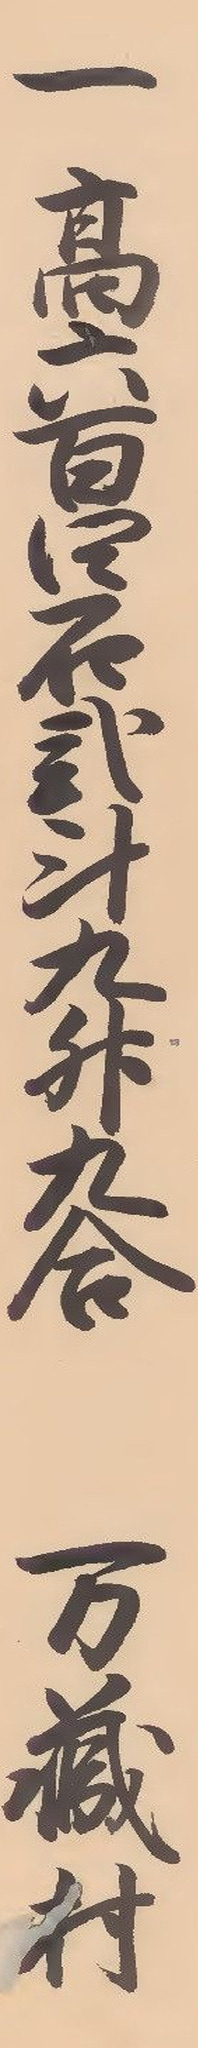一高六百四石弐斗九升九合万蔵村

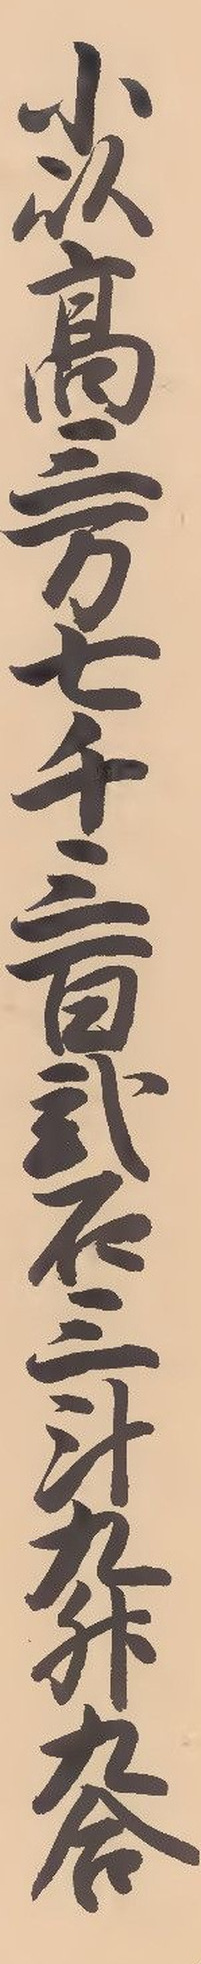小以高三万七千三百弐石三斗九升九合
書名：讃岐国郷帳
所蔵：国立公文書館 National Archives of Japan
